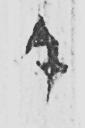千
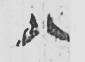八
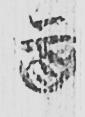百
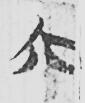六
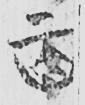百
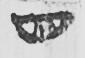四
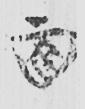百
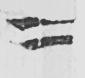二
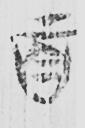百
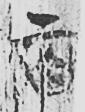百
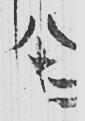八十=
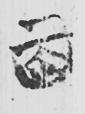百
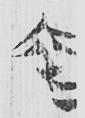六十=
